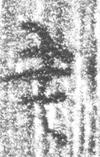屯
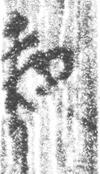厀（漆）
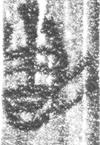彫（雕）
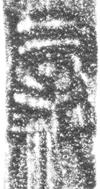奉厚
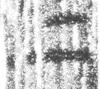二
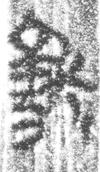○（合）
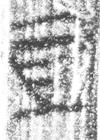豆
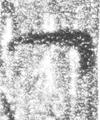一
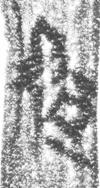○（橛）
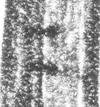二
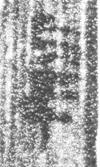橐
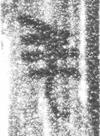屯
